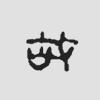故
